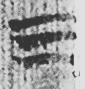三
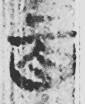百
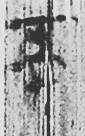五十=
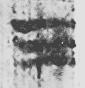三
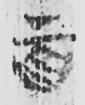百
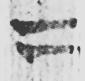二
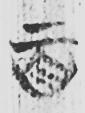百
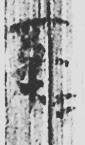五十=
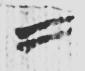二
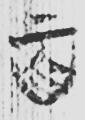百
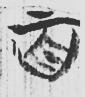百
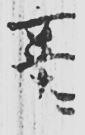五十=
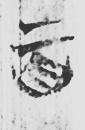百
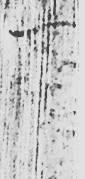五十=
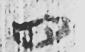四
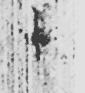十
